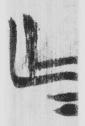亡=
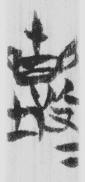壤=
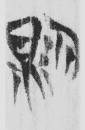則
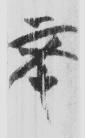不
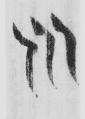川
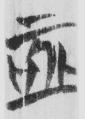亟
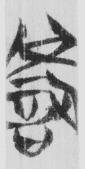罰
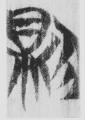則
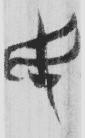民
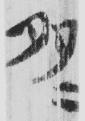多=
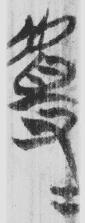虘又=
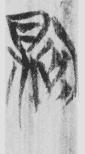則
